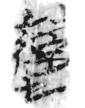䕬
